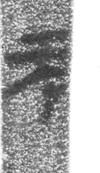天
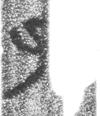子
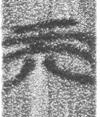而
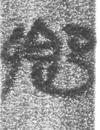卿
